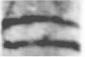二
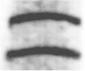二
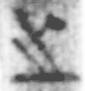之
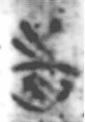齒
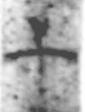七
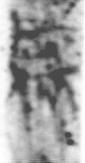聚
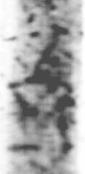環
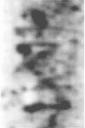韋
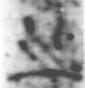之
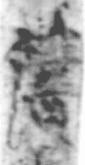○（席）
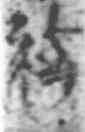紫
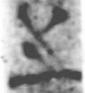之
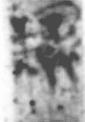○（表）
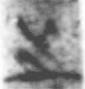之
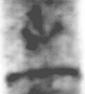之
